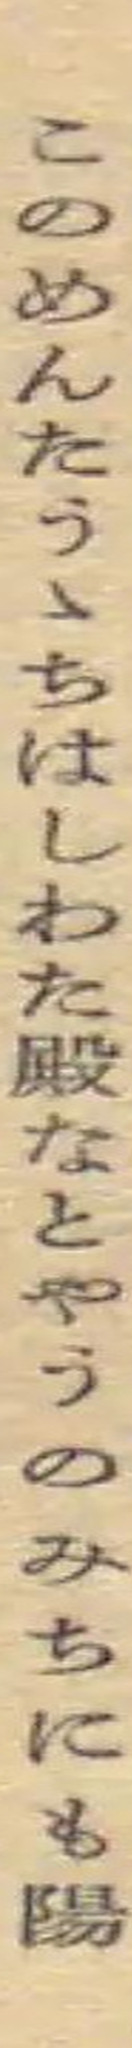このめんたうゝちはしわた殿なとやうのみちにも陽
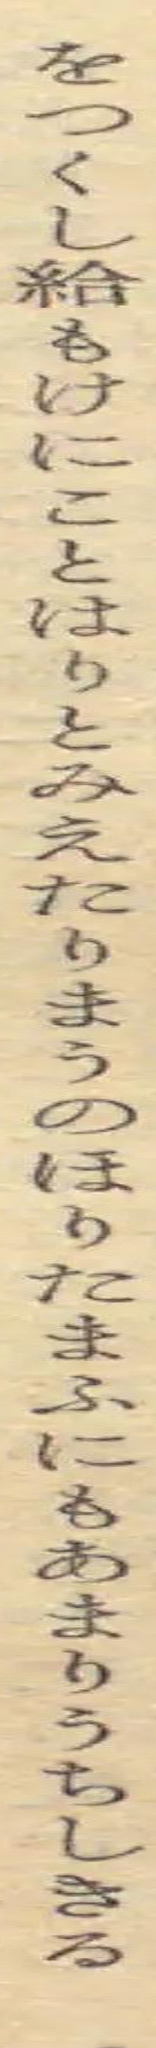をつくし給もけにことはりとみえたりまうのほりたまふにもあまりうちしきる
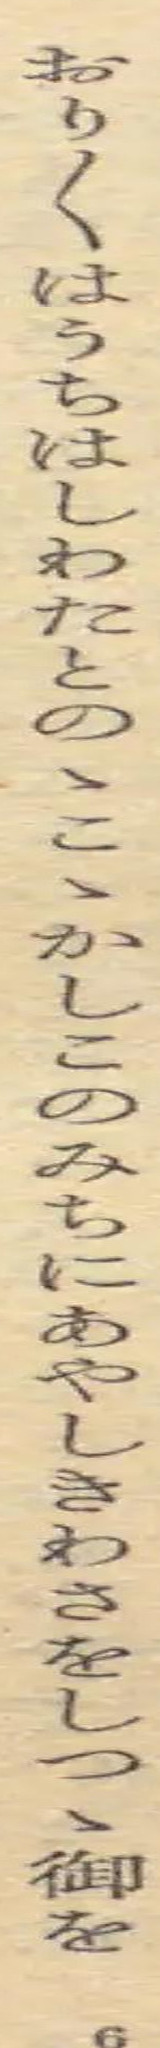おり〳〵はうちはしわたとのゝこゝかしこのみちにあやしきわさをしつゝ御を
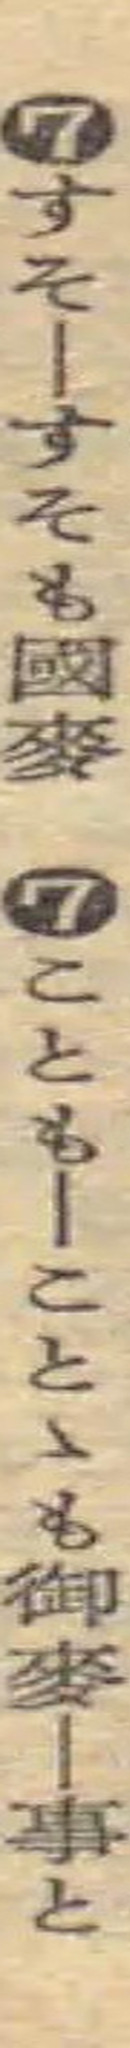❼すそ―すそも国麦❼ことも―ことゝも御麦―事と
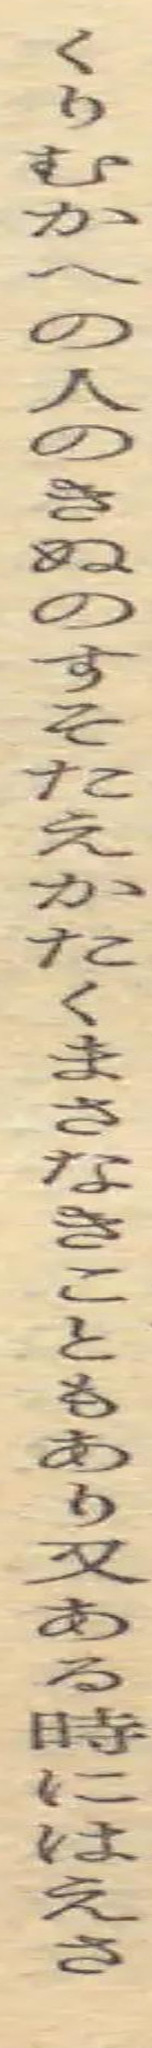くりむかへの人のきぬのすそたえかたくまさなきこともあり又ある時にはえさ
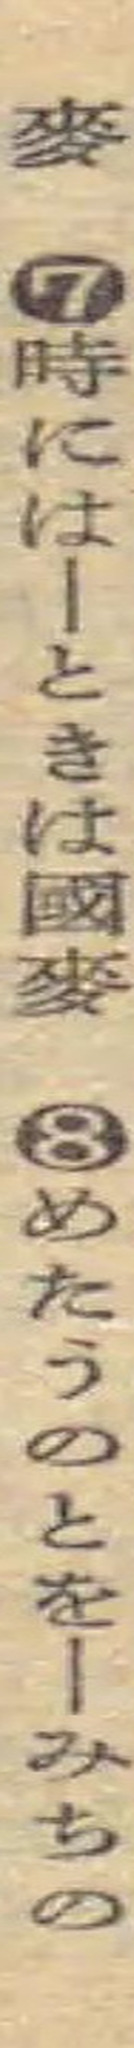麦❼時には―ときは国麦❽めたうのとを―みちの
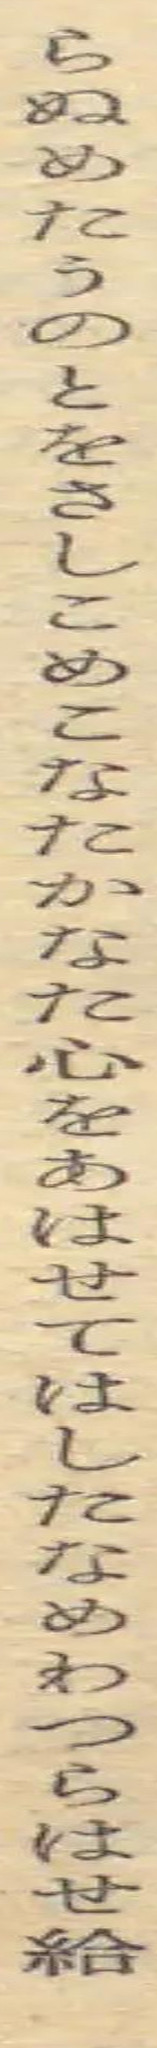らぬめたうのとをさしこめこなたかなた心をあはせてはしたなめわつらはせ給
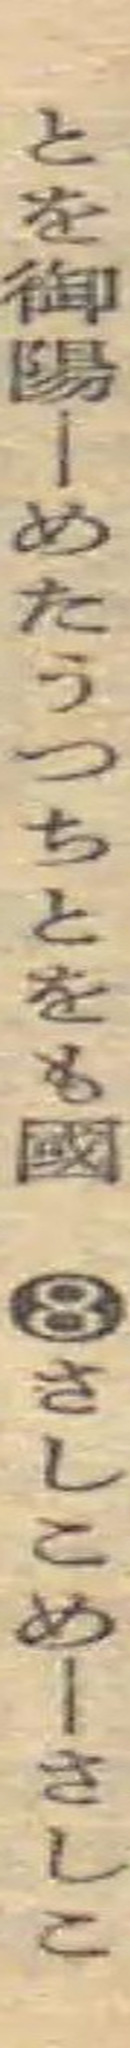とを御陽―めたうつちとをも国❽さしこめ―さしこ
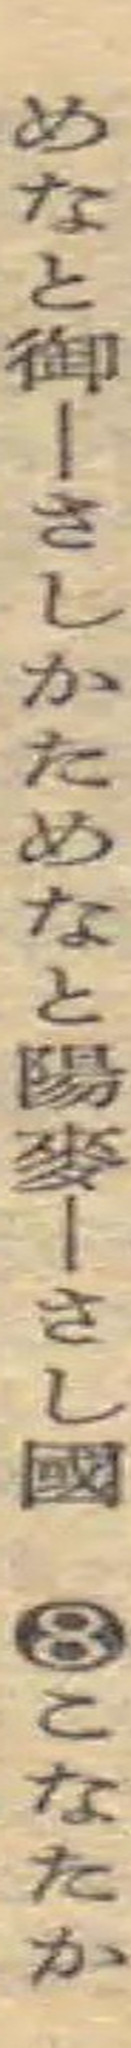めなと御―さしかためなと陽麦―さし国❽こなたか
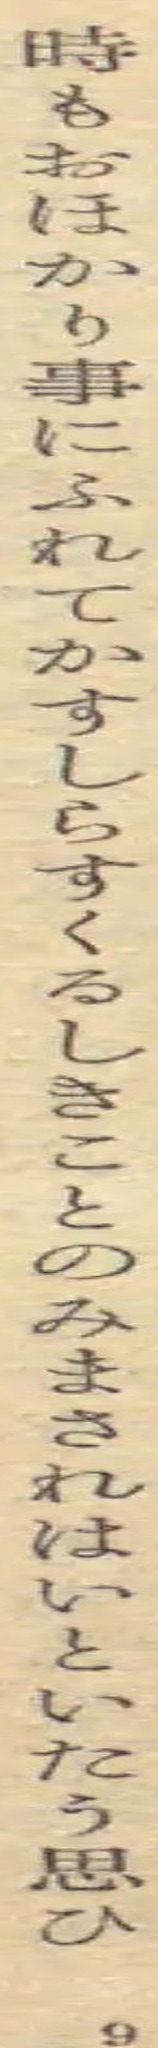時もおほかり事にふれてかすしらすくるしきことのみまされはいといたう思ひ
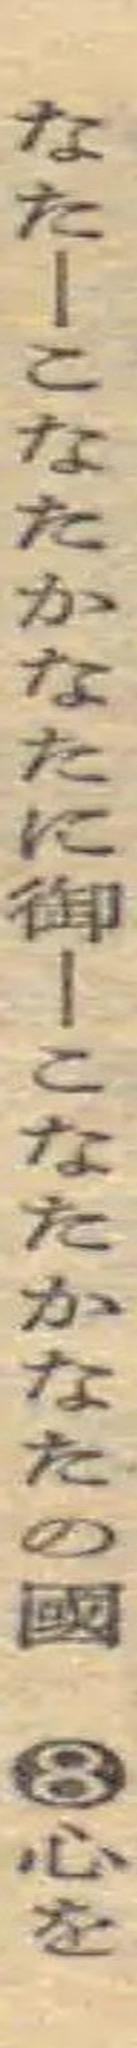なた―こなたかなたに御―こなたかなたの国❽心を
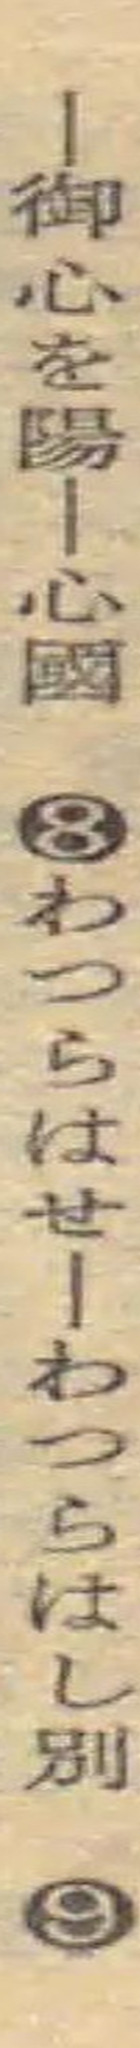―御心を陽―心国❽わつらはせ―わつらはし別❾
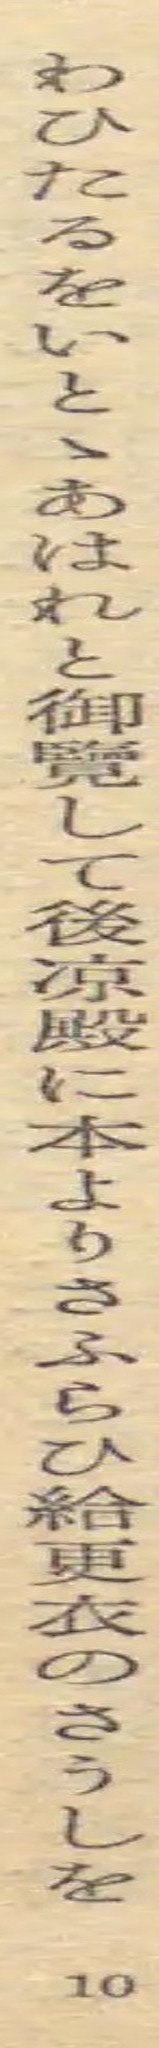わひたるをいとゝあはれと御覧して後凉殿に本よりさふらひ給更衣のさうしを
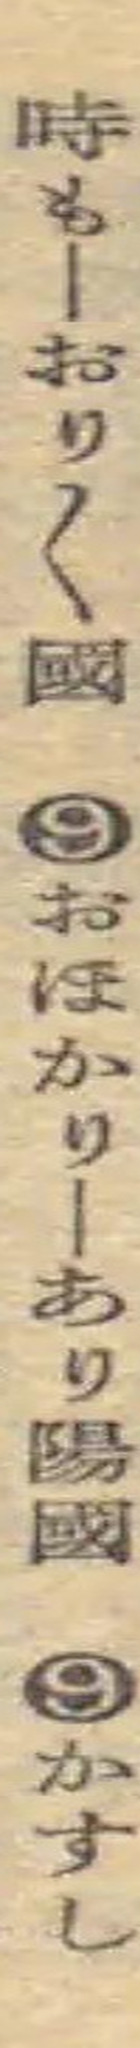時も―おり〳〵国❾おほかり―あり陽国❾かすし
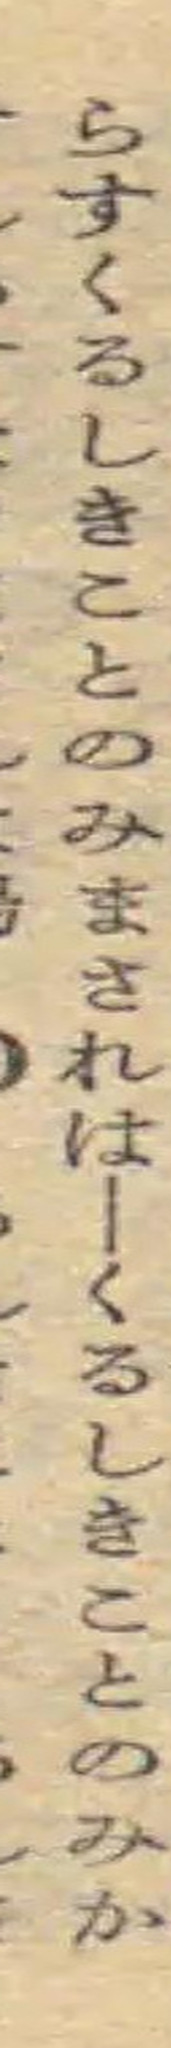らすくるしきことのみまされは―くるしきことのみか
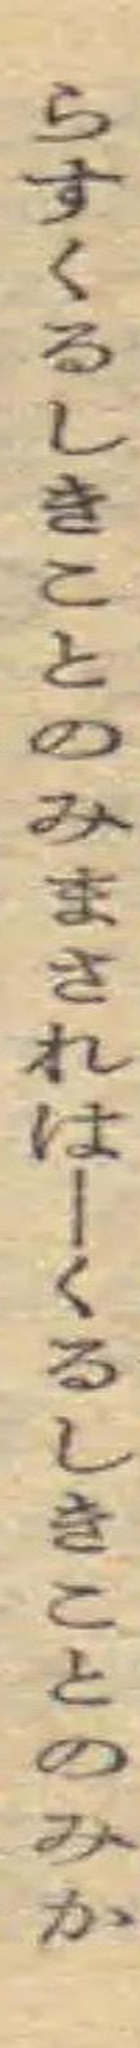らすくるしきことのみまされは―くるしきことのみか
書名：校異源氏物語.
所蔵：国立国会図書館 National Diet Library, JAPAN
